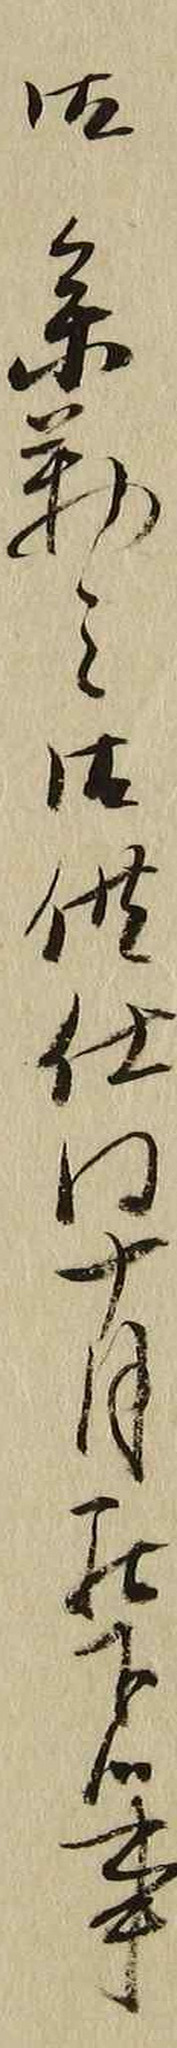御参勤之御供仕同十月罷下候事
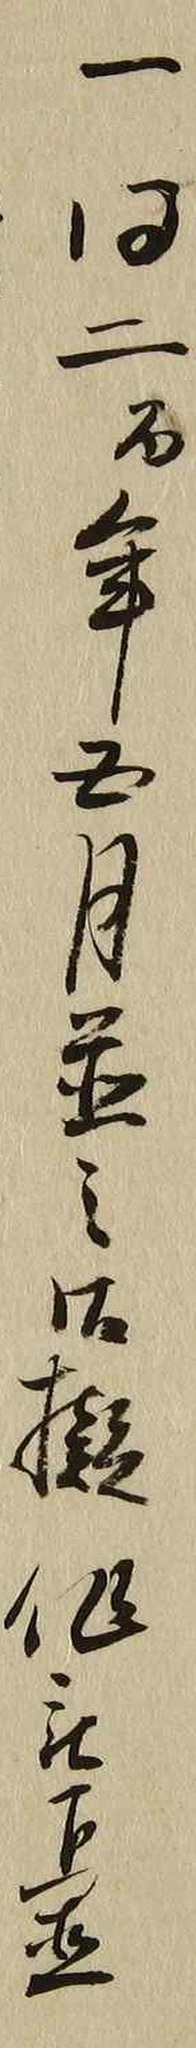一同二酉年五月並之御擬作被下置
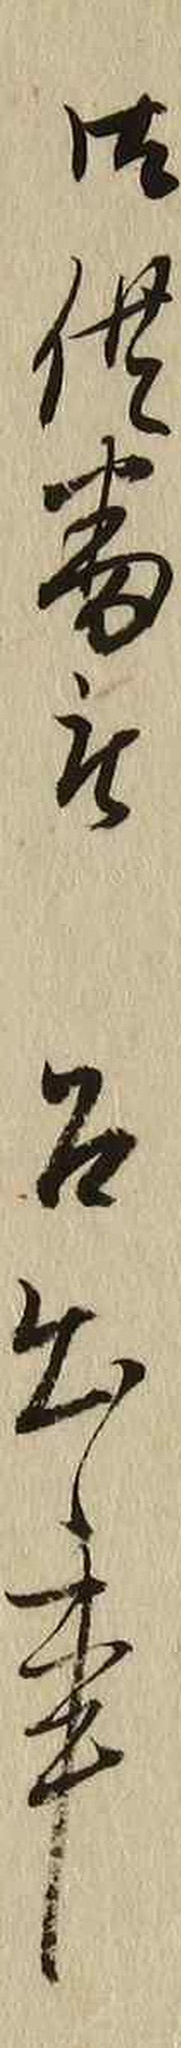御供番被召出候事
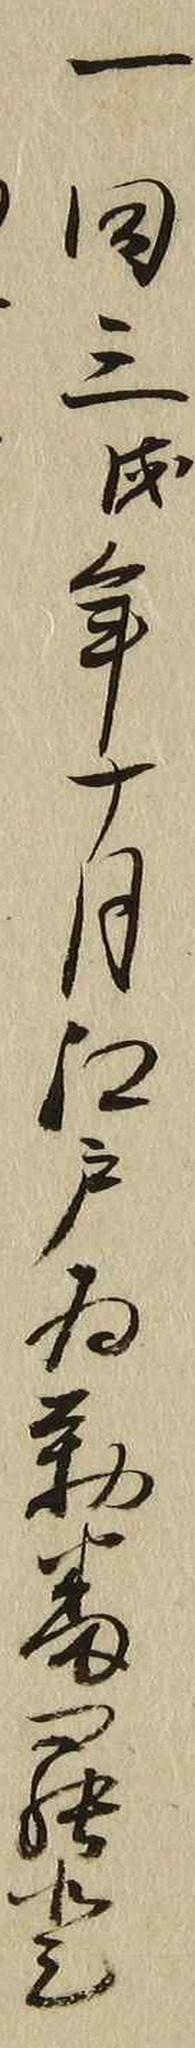一同三戌年十月江戸為勤番罷登
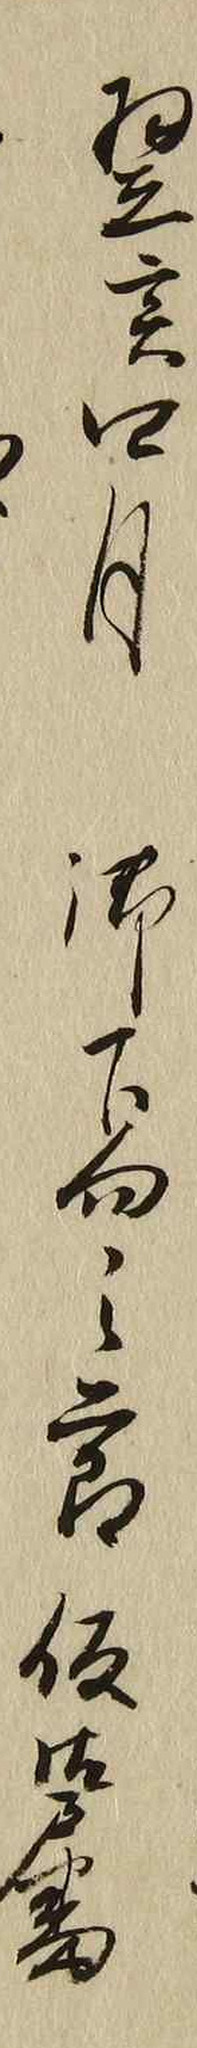翌亥四月御下向之節仮御戸番
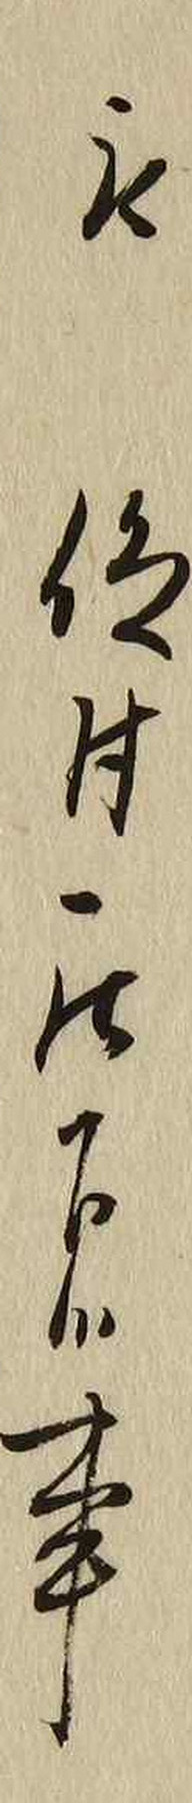被仰付罷下候事
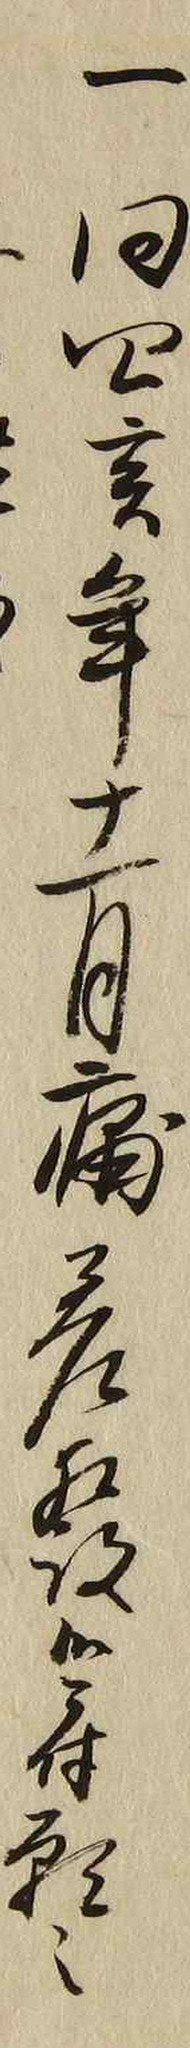一同四亥年十一月痛差発候ニ付願之
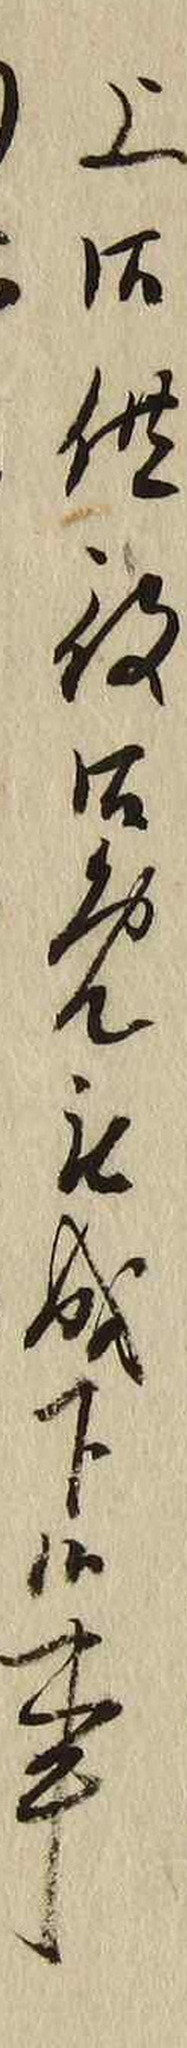上御供役御免被成下候事
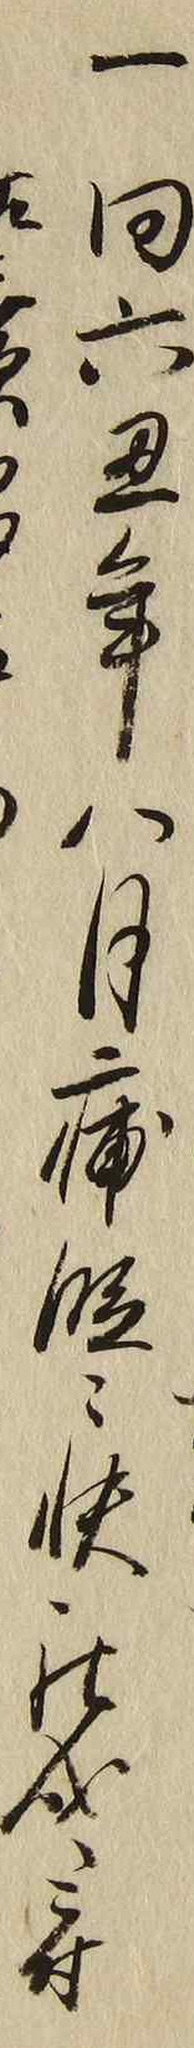一同六丑年八月痛段々快罷成候ニ付
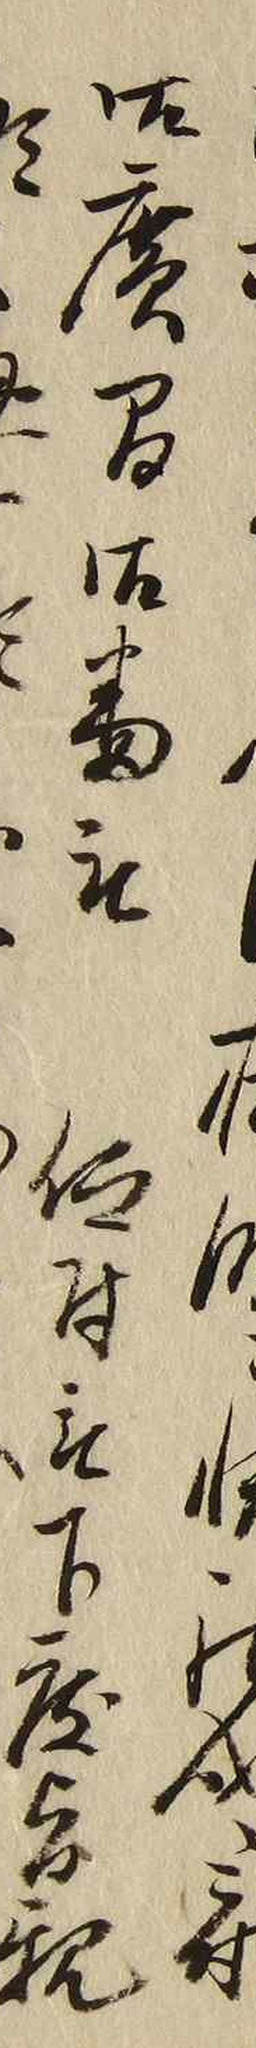御広間御番被仰付被下度旨親
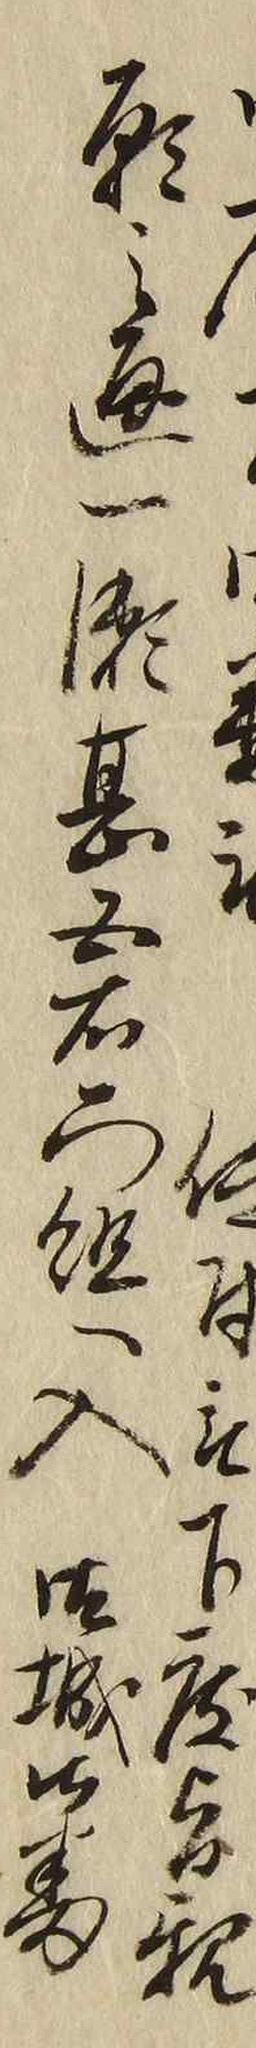願之通一瀬甚五右衛門組へ入御城御番

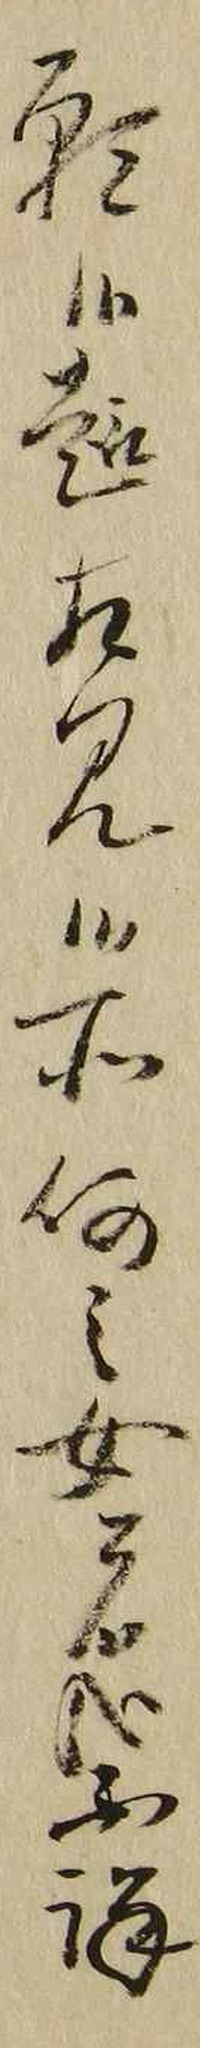願候趣相見候所何之女ニ候哉不詳
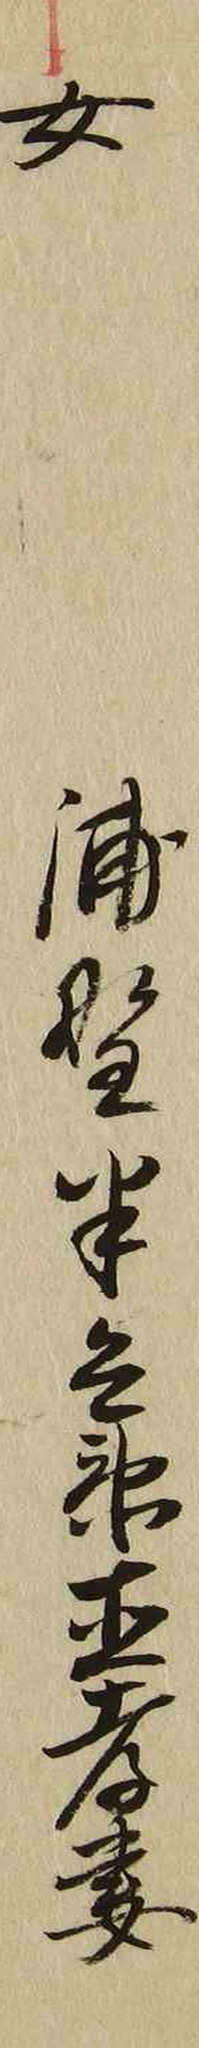女浦野半兵衛直孝妻
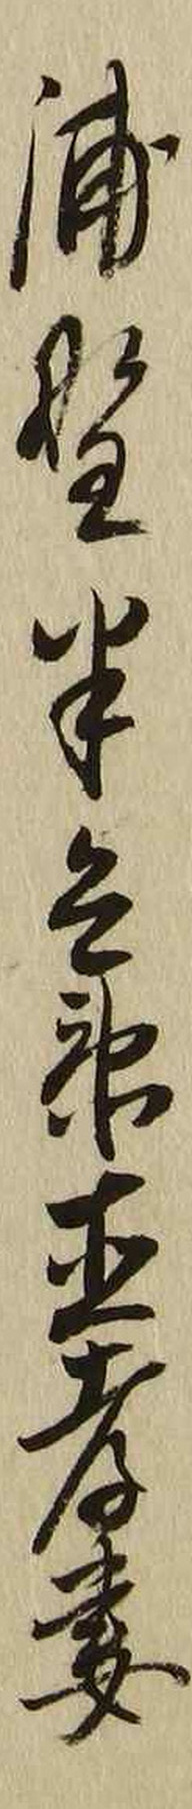女浦野半兵衛直孝妻
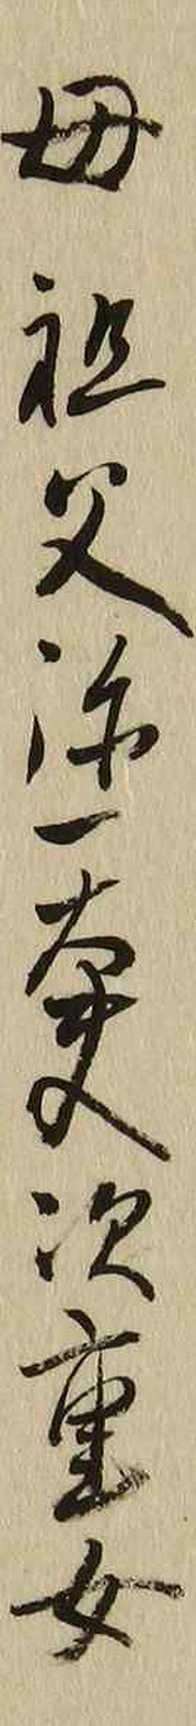母祖父弥一大夫次重女
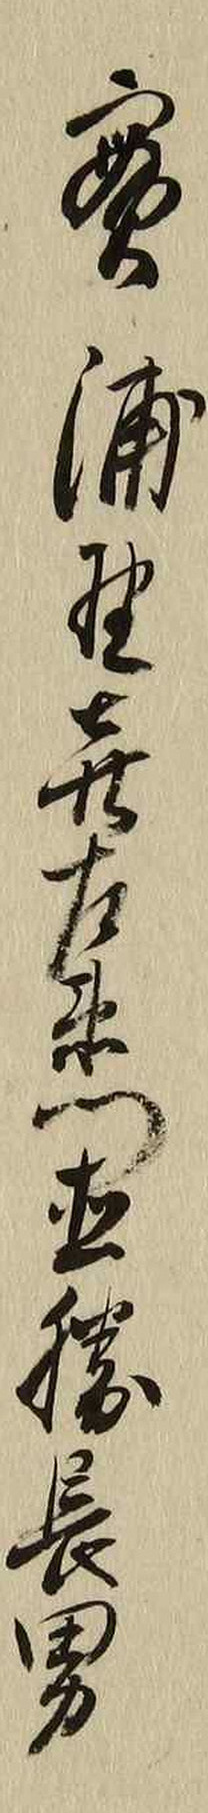実浦野喜左衛門直勝長男
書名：諸士系譜　巻之348　も之部4
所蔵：会津若松市立会津図書館
